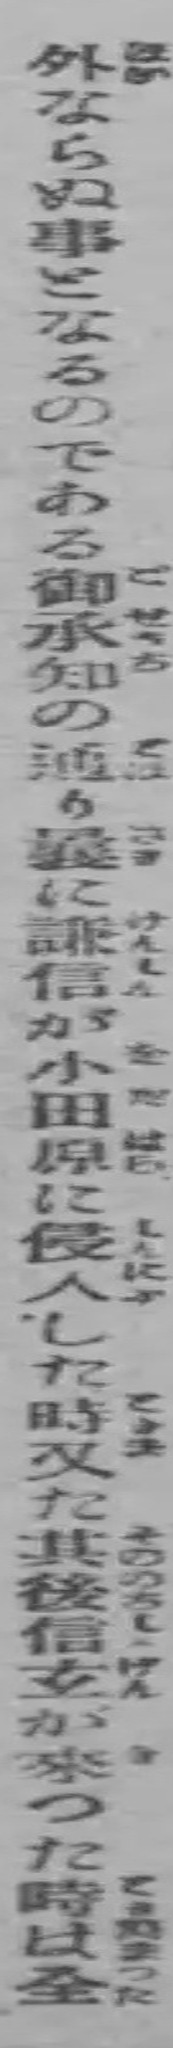外ならぬ事となるのである御承知の通り曩に謙信が小田原に侵入した時又た其後信玄が来つた時は全
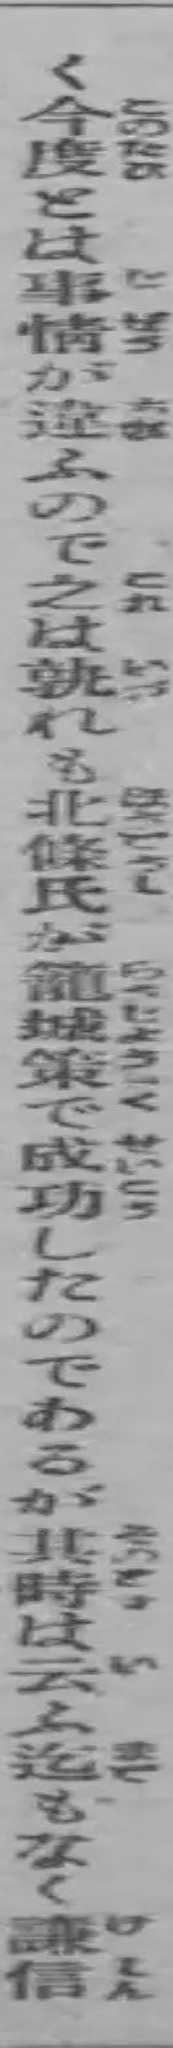く今度とは事情が違ふので之は孰れも北條氏が籠城策で成功したのであるが其時は云ふ迄もなく謙信
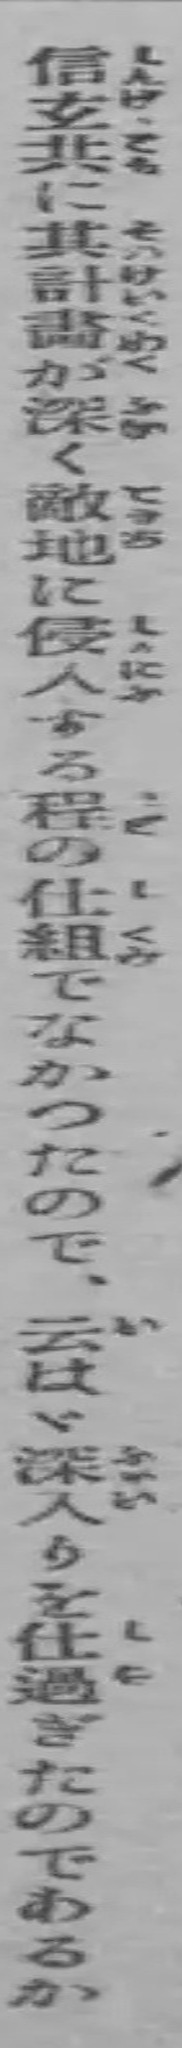信玄共に其計画が深く敵地に侵入する程の仕組でなかつたので、云はゞ深入りを仕過ぎたのであるか
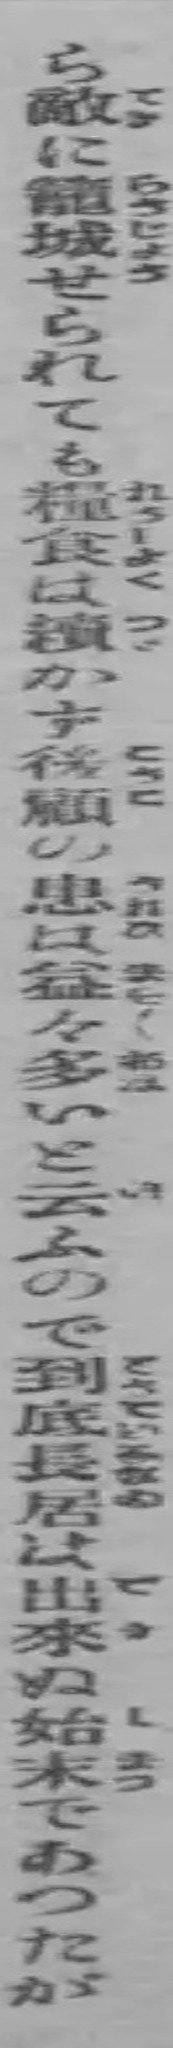ら敵に籠城せられても糧食は続かず後顧の患は益々多いと云ふので到底長居は出来ぬ始末であつたが
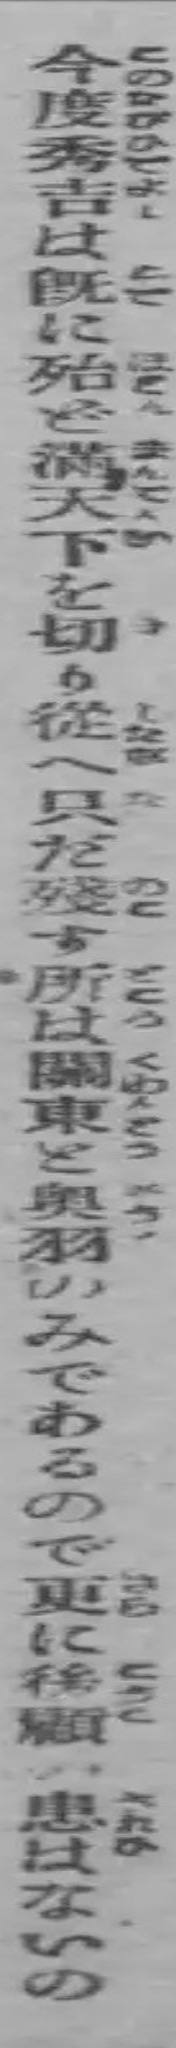今度秀吉は既に殆ど満天下を切り従へ只だ残す所は関東と奥羽のみであるので更に後顧の患はないの
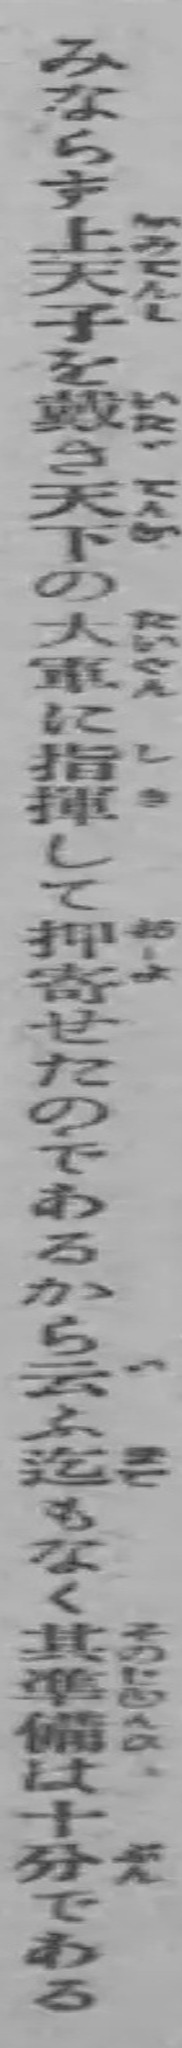みならず上天子を戴き天下の大軍に指揮して押寄せたのであるから云ふ迄もなく其準備は十分である
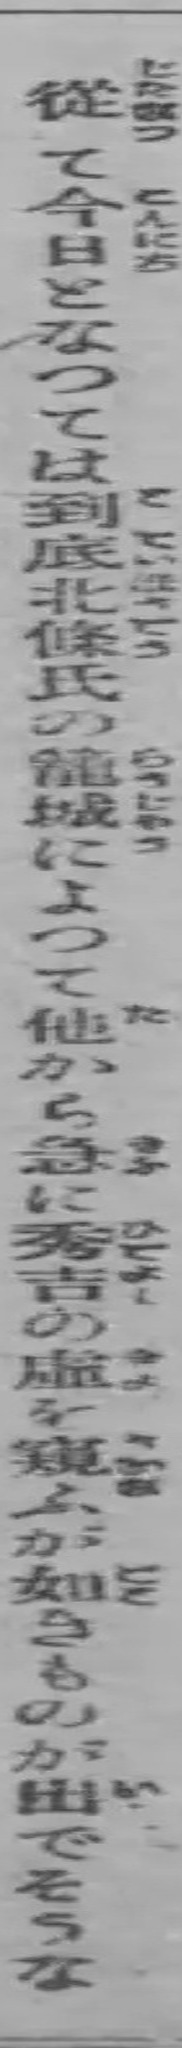従て今日となつては到底北條氏の籠城によつて他から急に秀吉の虚を窺ふが如きものが出でそうな
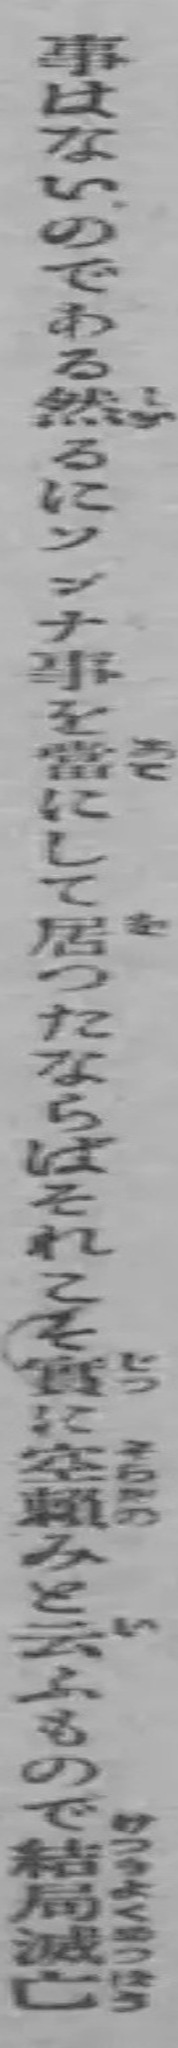事はないのである然るにソンナ事を当にして居つたならばそれこそ実に空頼みと云ふもので結局滅亡
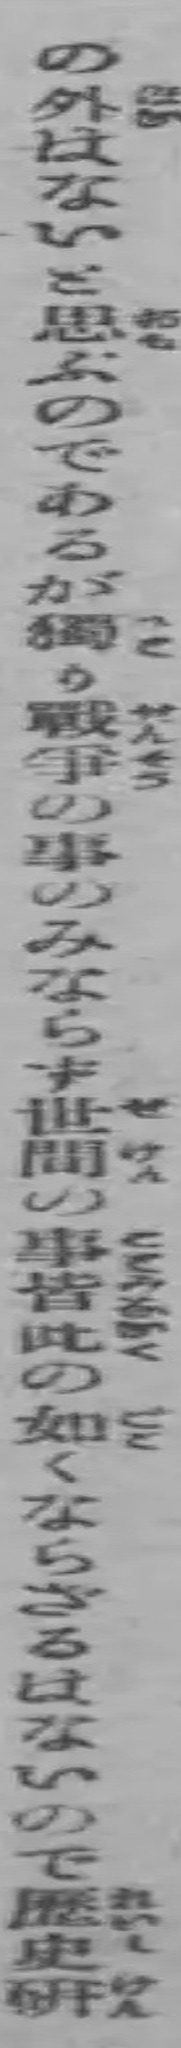の外はないと思ふのであるが独り戦争の事のみならず世間の事皆此の如くならざるはないので歴史研
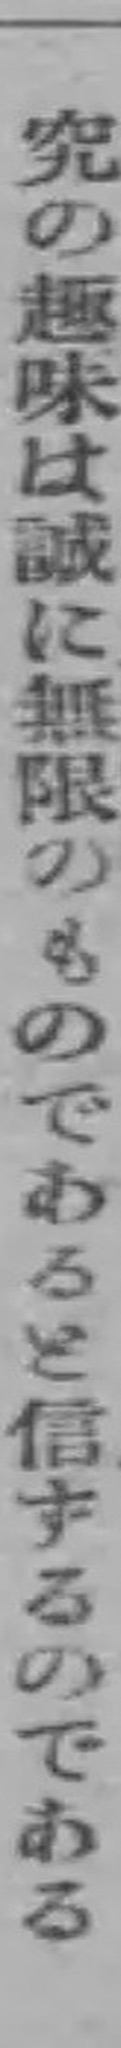究の趣味は誠に無限のものであると信ずるのである
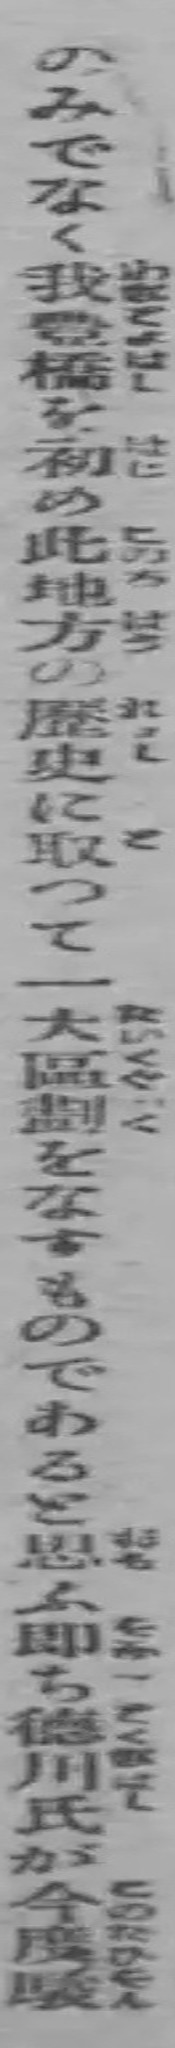のみでなく我豊橋を初め此地方の歴史に取つて一大区画をなすものであると思ふ即ち徳川氏が今度駿
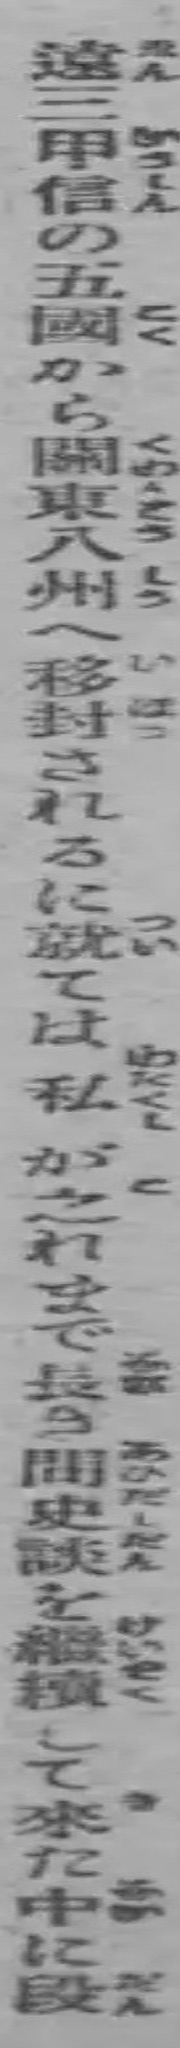遠三甲信の五国から関東八州へ移封されるに就ては私が之れまで長き間史談を継続して来た中に段
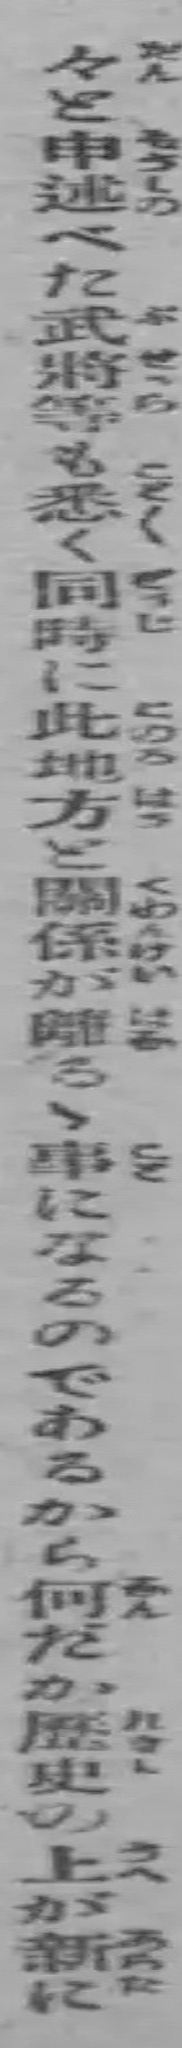段と申述べた武将等も悉く同時に此地方と関係が離るゝ事になるのであるから何だか歴史の上が新に
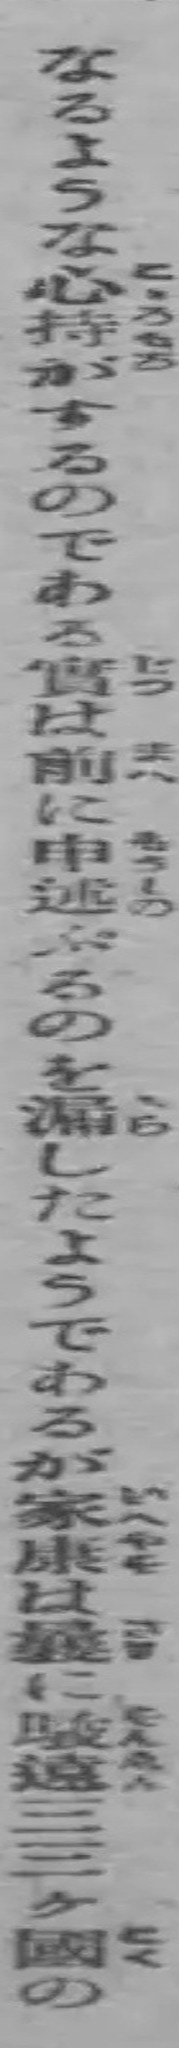なるような心持がするのである実は前にも申述ぶるのを漏したようであるが家康は曩に駿遠三三ケ国の
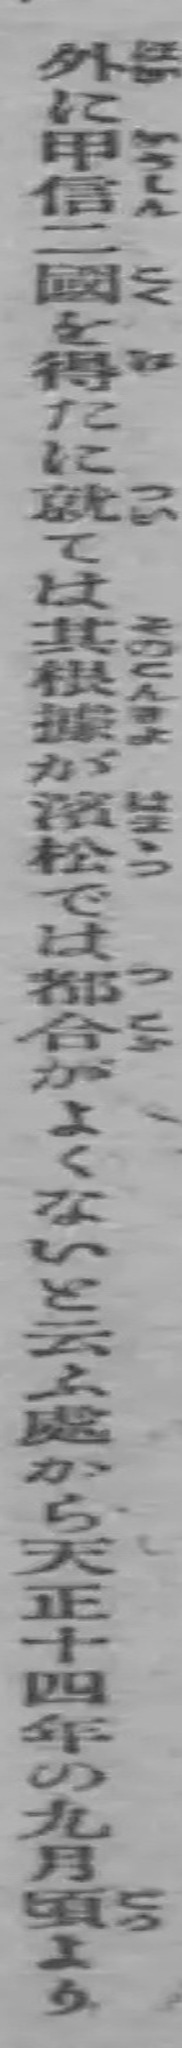外に甲信二国を得たに就ては其根拠が浜松では都合がよくないと云ふ処から天正十四年の九月頃より
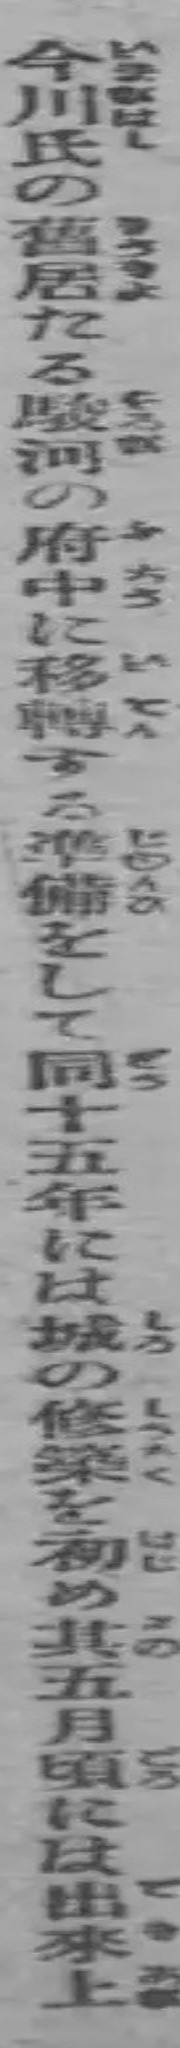今川氏の旧居たる駿河の府中に移転する準備をして同十五年には城の修築を初め其五月頃には出来上
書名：豊橋市史談
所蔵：国立国会図書館 National Diet Library, JAPAN
